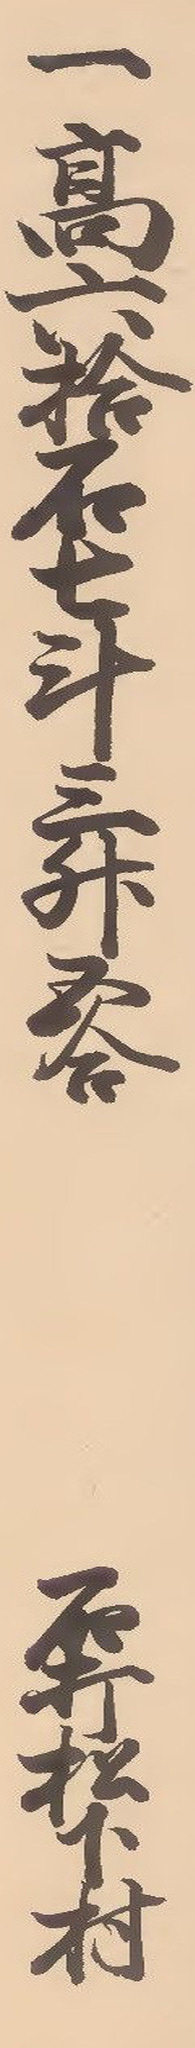一高六拾石七斗三升五合石打松下村
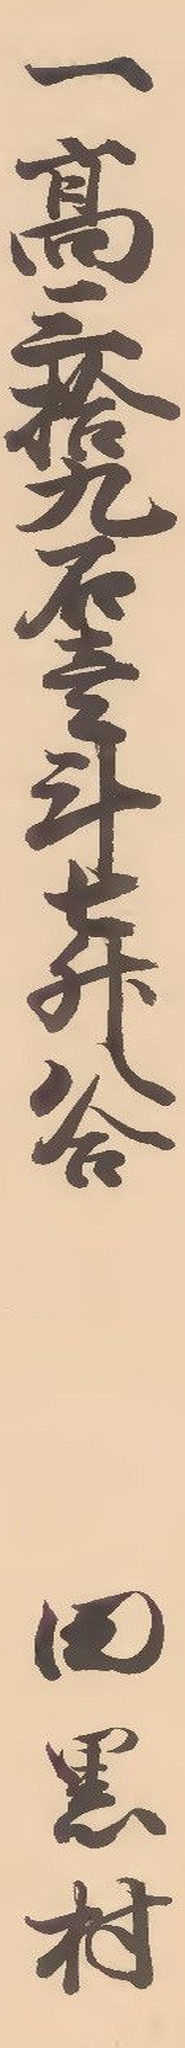一高三拾九石壱斗七升八合田黒村
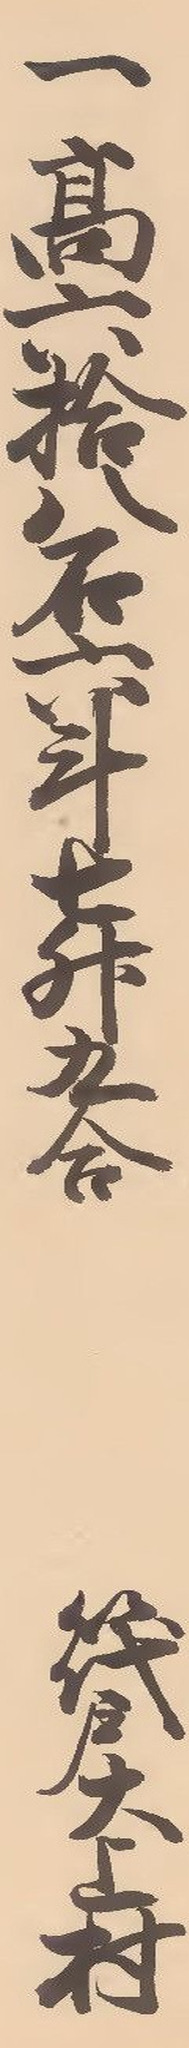一高六拾八石六斗七升九合筏戸大上村
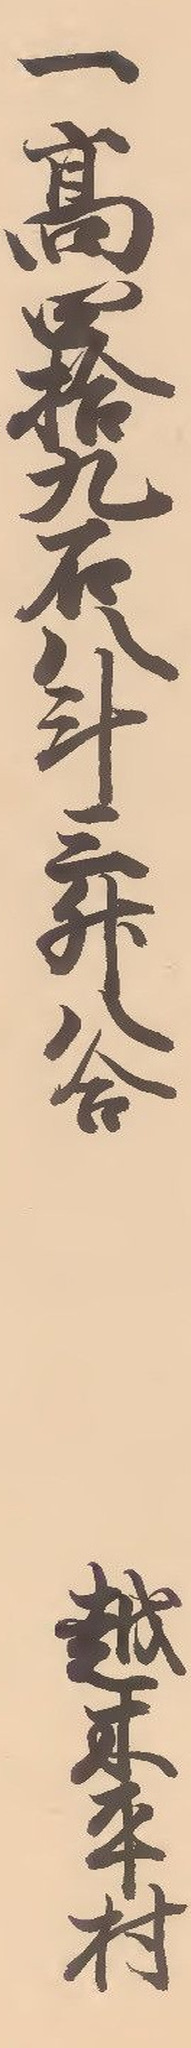一高四拾九石八斗三升八合越木平村

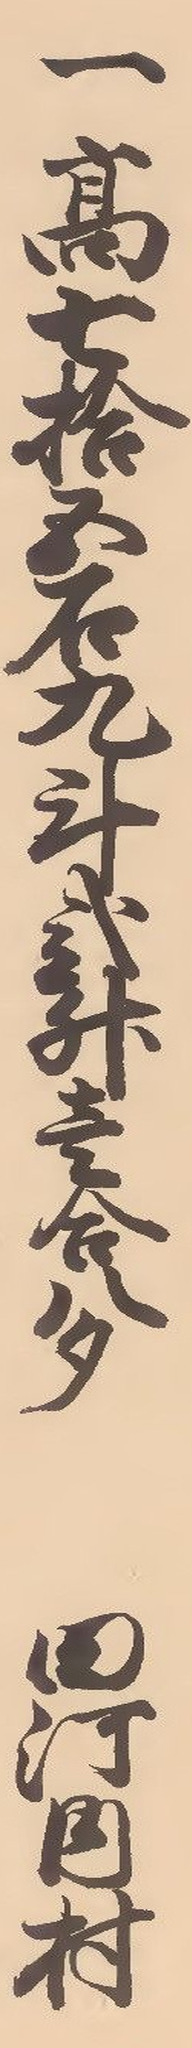一高七拾五石九斗弐升壱合八勺田河内村
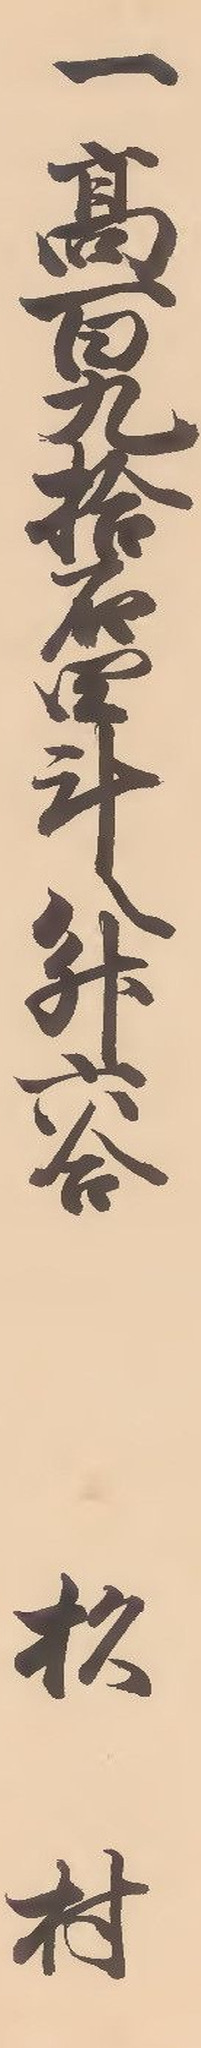一高百九拾石四斗八升六合杉村
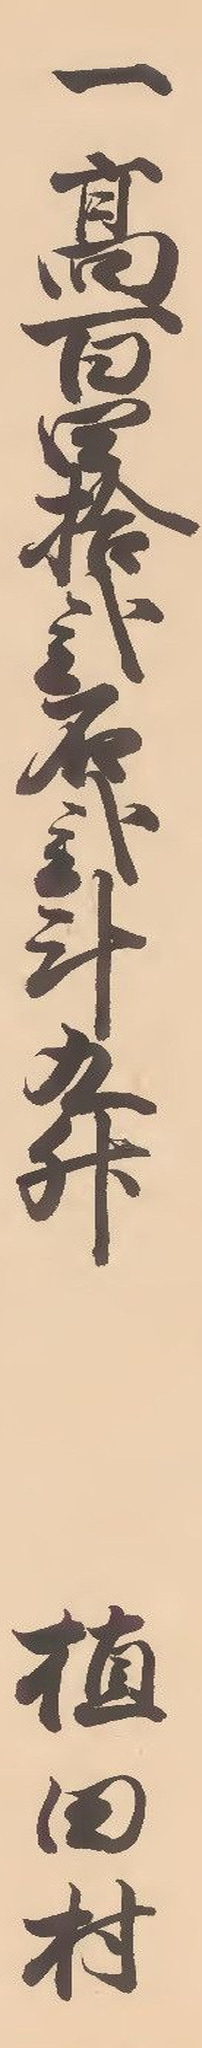一高百四拾弐石弐斗九升植田村
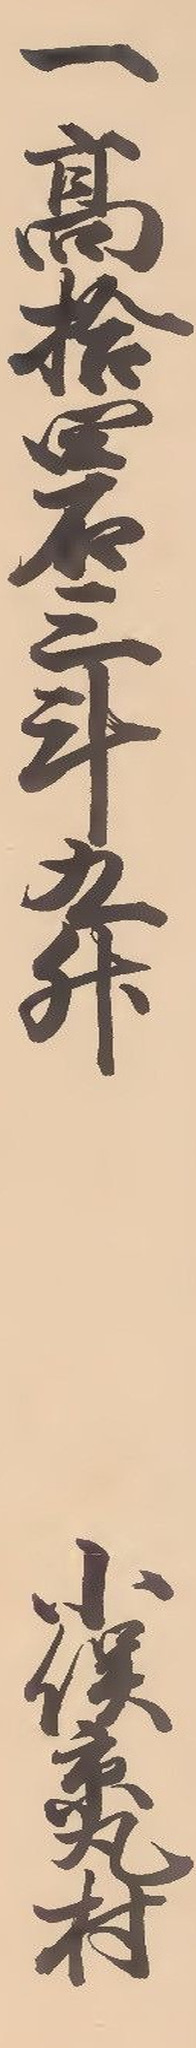一高拾四石三斗九升小俣京丸村
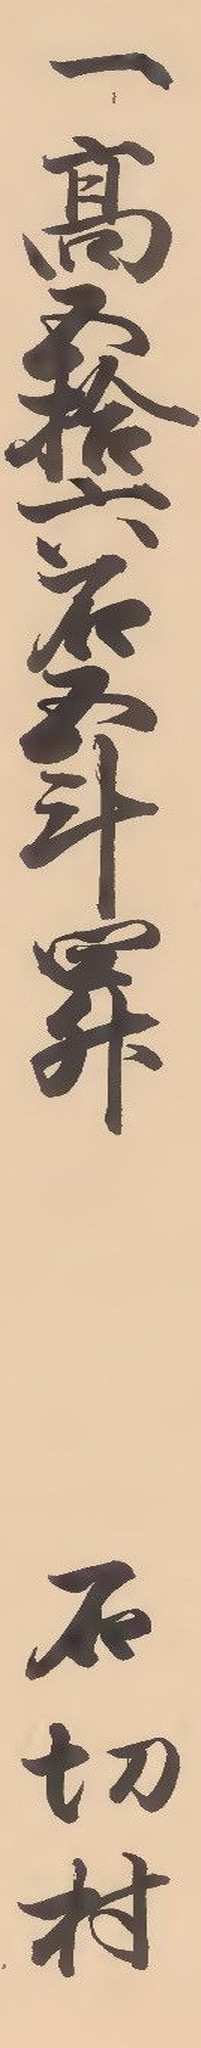一高五拾六石五斗四升石切村
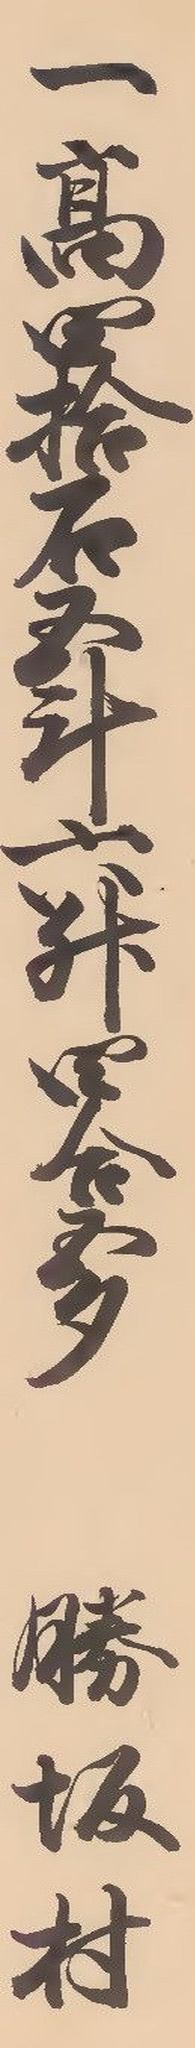一高四拾石五斗六升四合五勺勝坂村
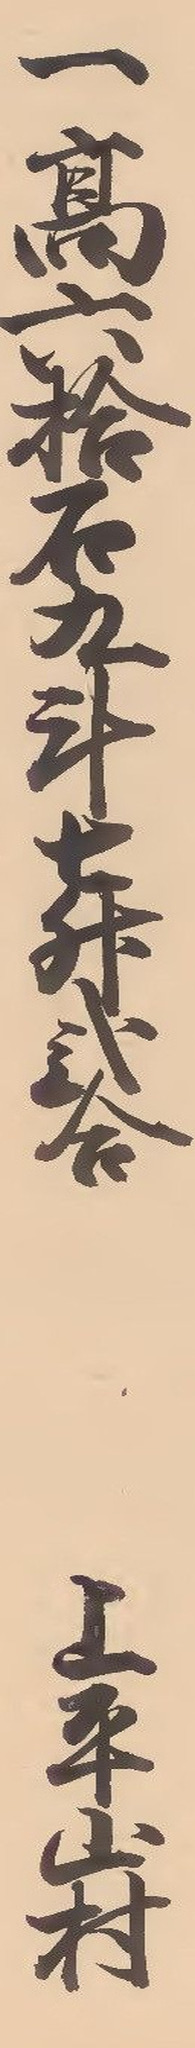一高六拾石九斗七升弐合上平山村

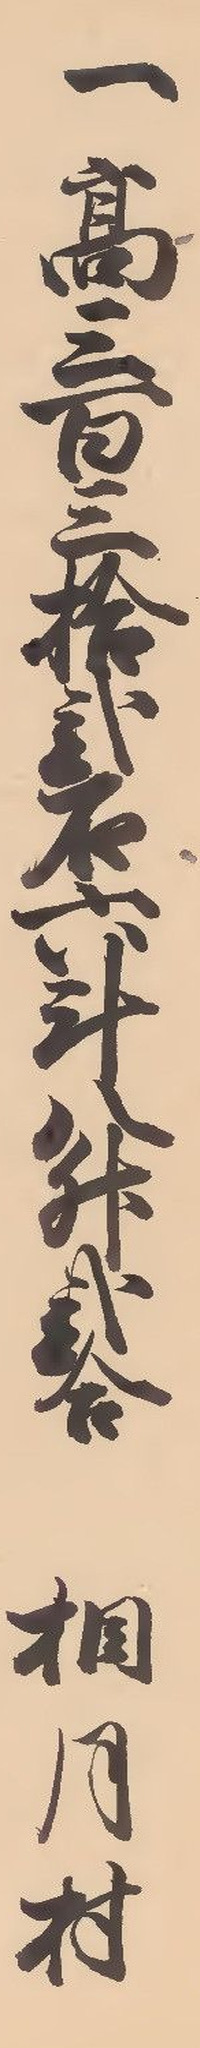一高三百三拾弐石六斗八升弐合相月村
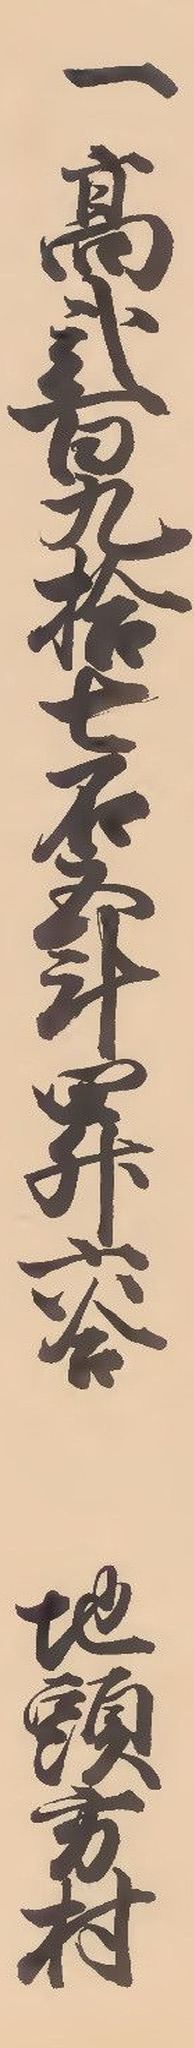一高弐百九拾七石五斗四升六合地頭方村
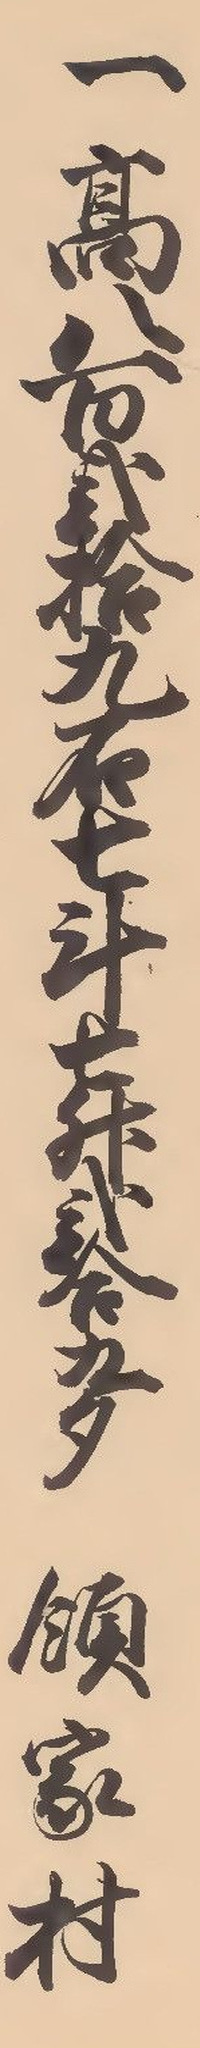一高八百弐拾九石七斗七升弐合九勺領家村
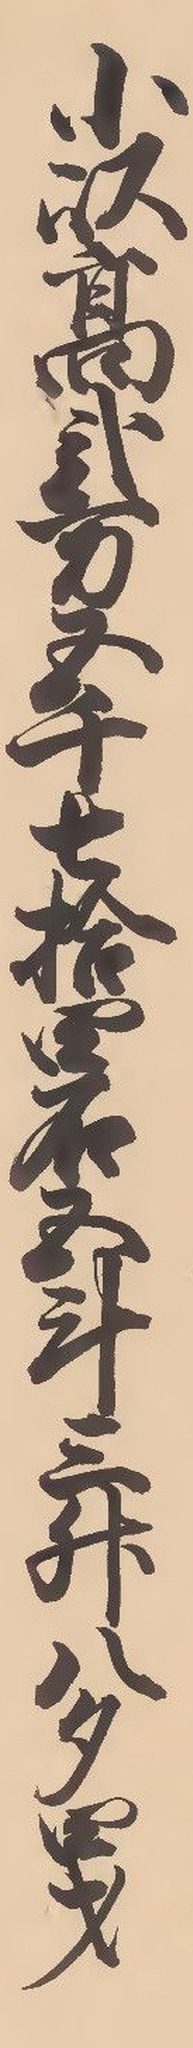小以高弐万五千七拾四石五斗三升八勺四才

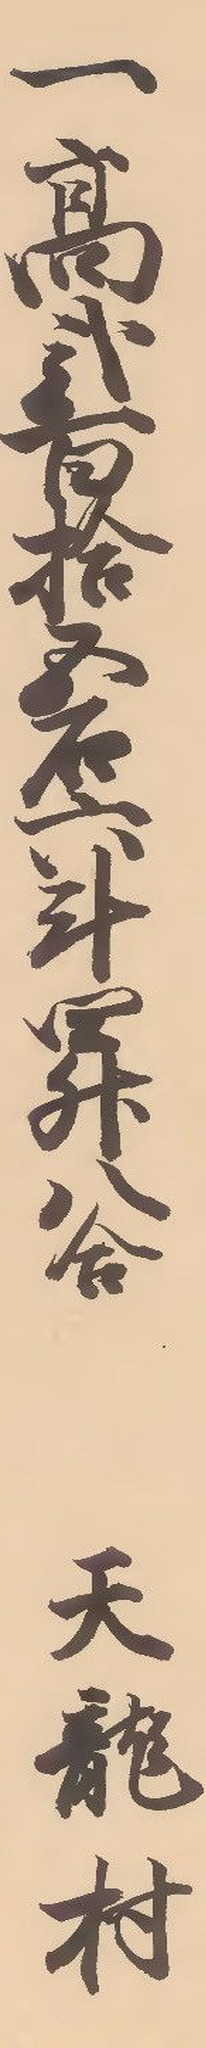一高弐百拾五石六斗四升八合天竜村
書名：遠江国郷帳
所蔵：国立公文書館 National Archives of Japan
